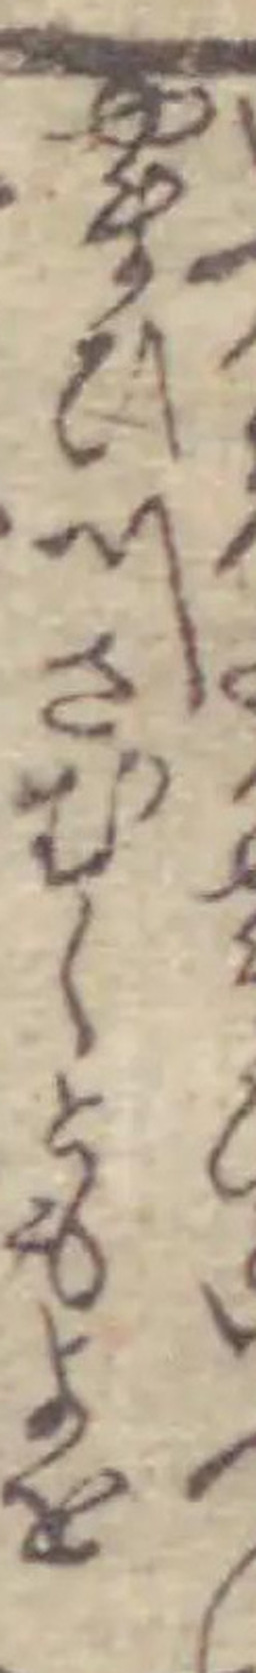やまひ「さむくともよを
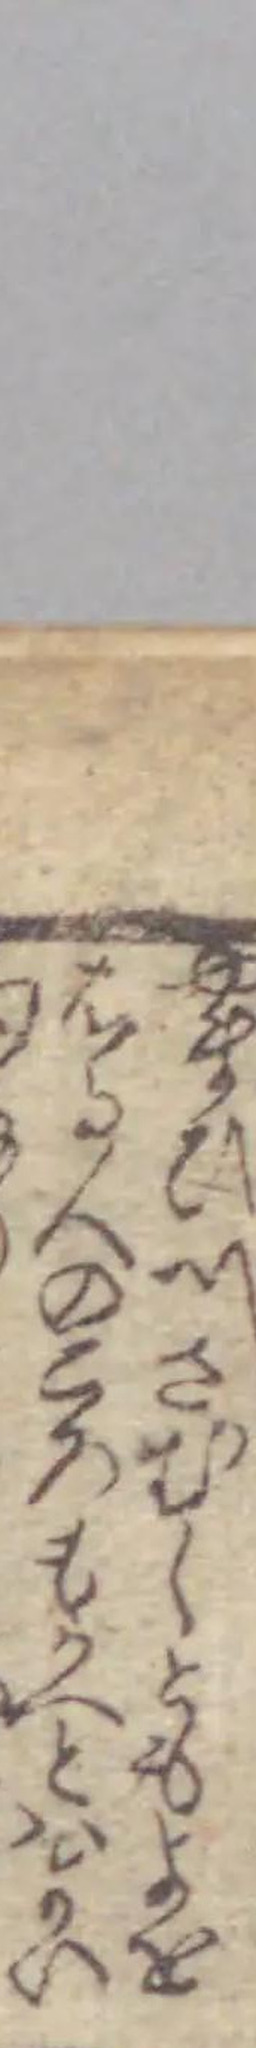はる人のころもかへとはよい
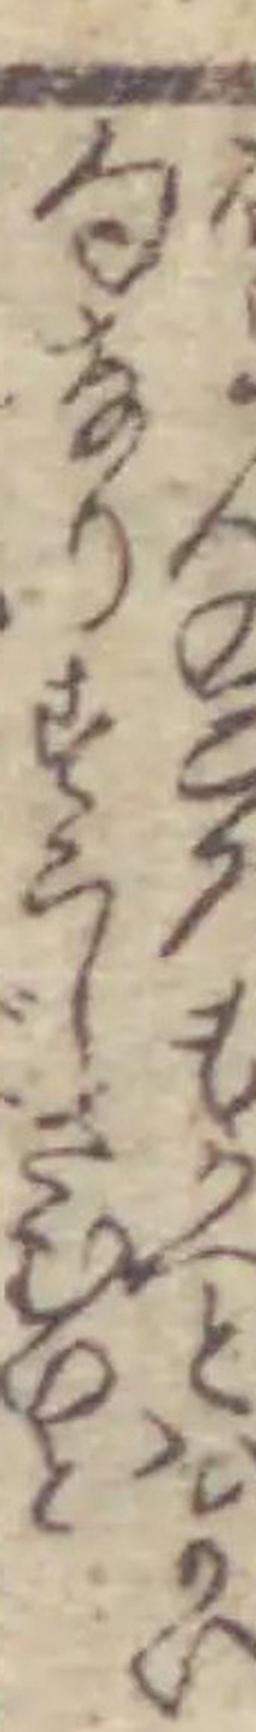句なりすこしさむいと
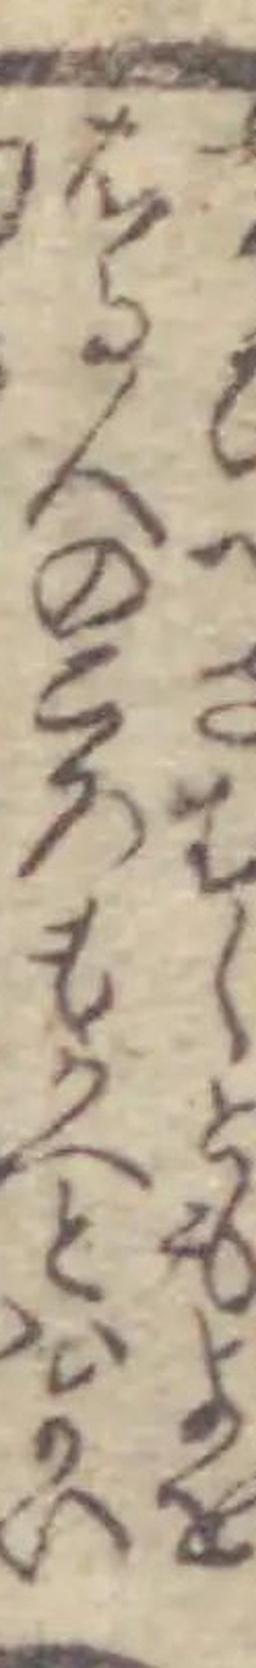はる人のころもかへとはよい
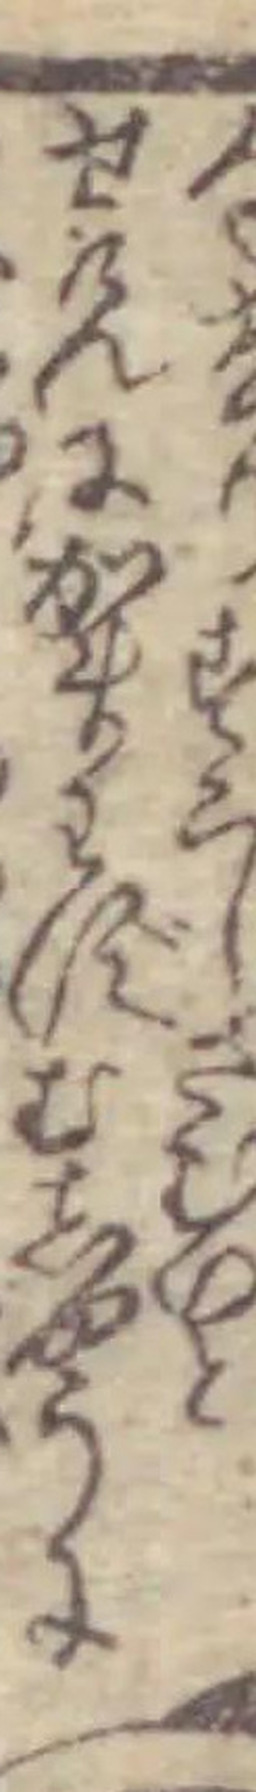せけんにかまわずむしやうに
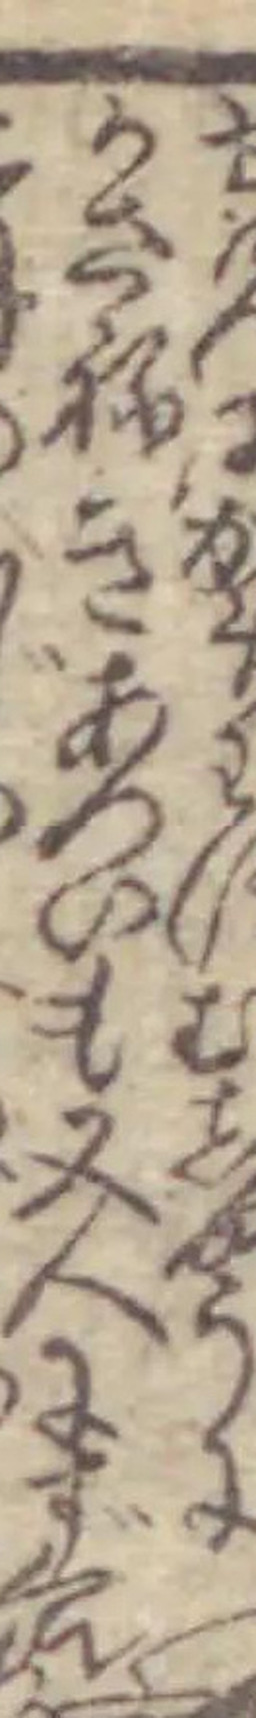かさねぎあついも又人にすぐれ
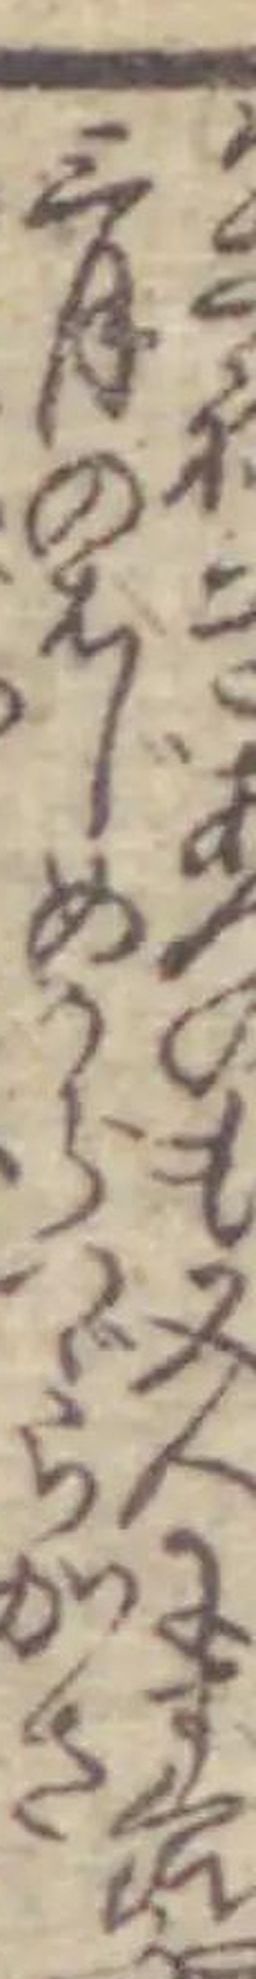三月のはじめからつゞらかさ
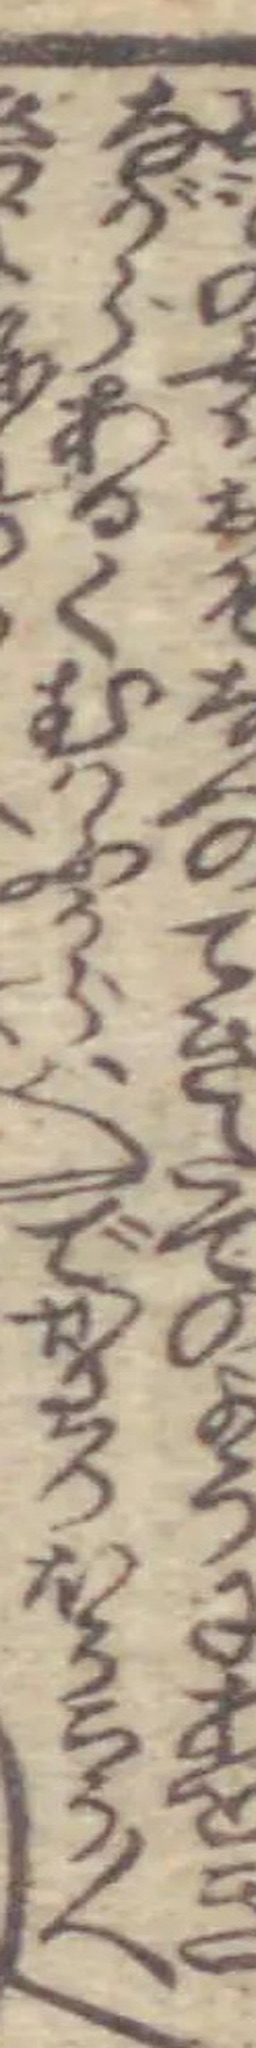ながらあるくむかふからはでかわりほうこう人
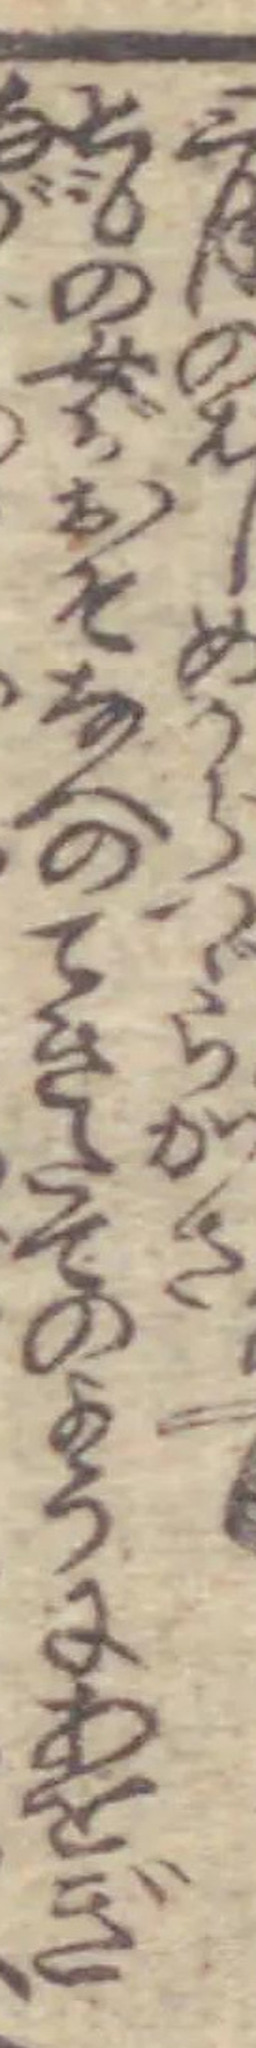ともの女がおそなへのてきたてのようにあをぎ
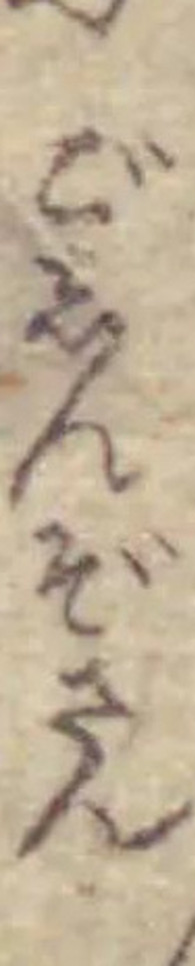ごしんぞさん
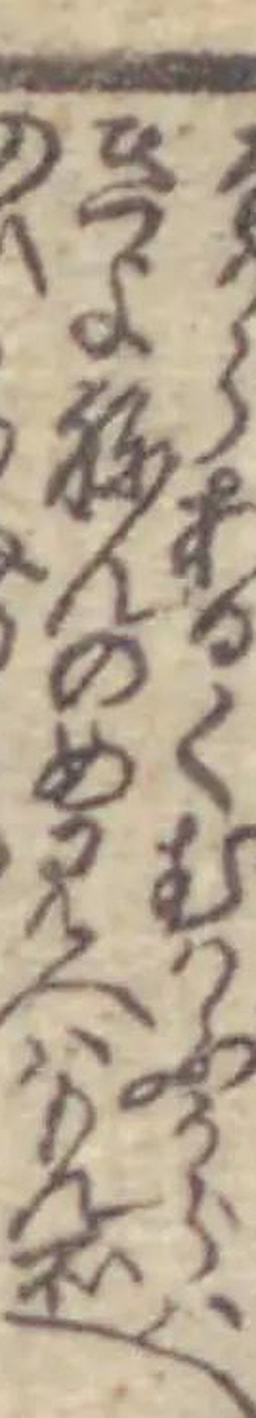きよねんのめ見へはもん所
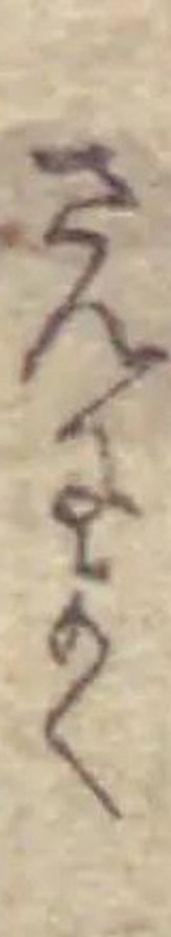さんによく
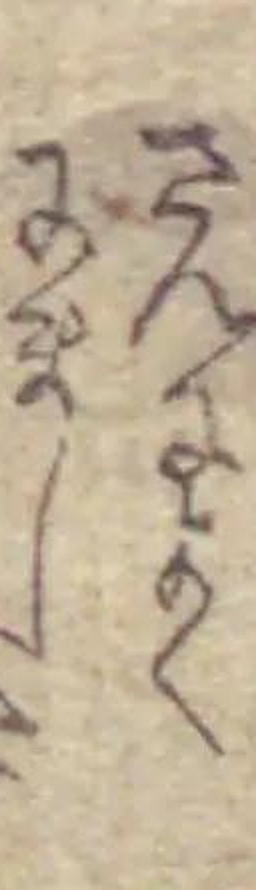にました
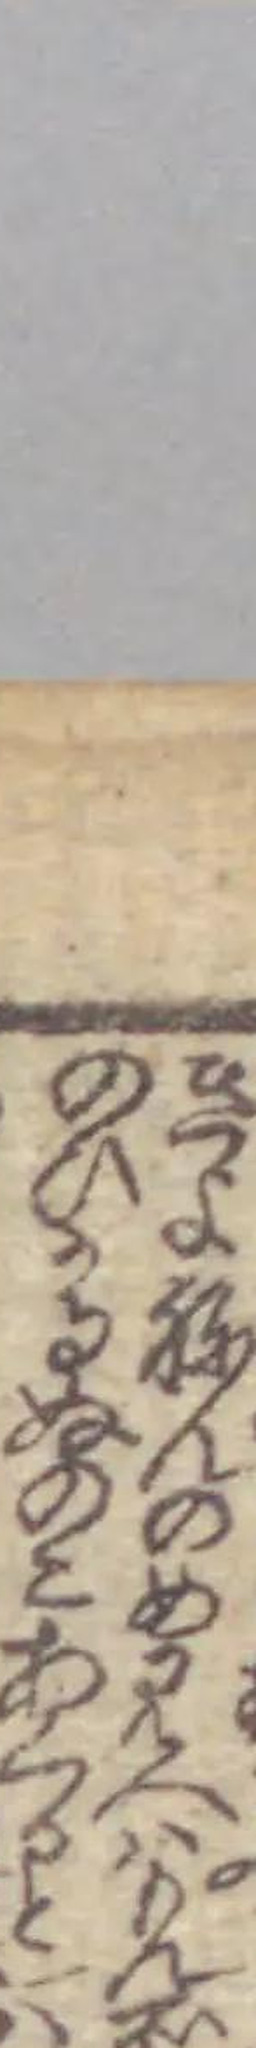のひかるぬのこあくるとしは
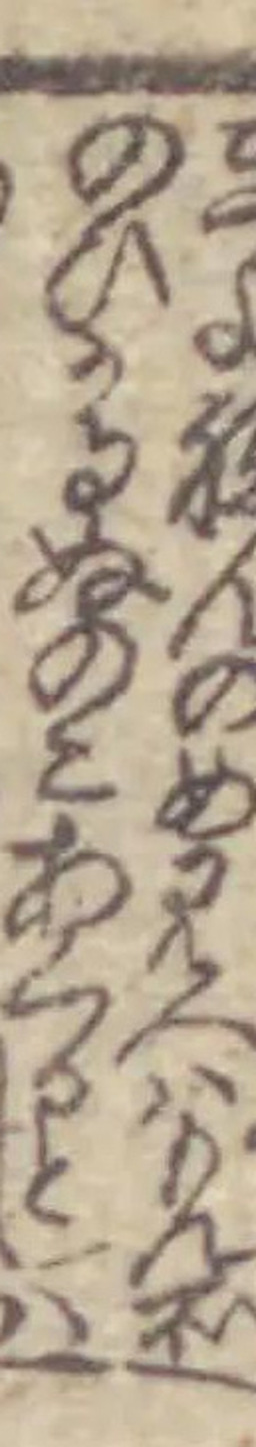のひかるぬのこあくるとしは
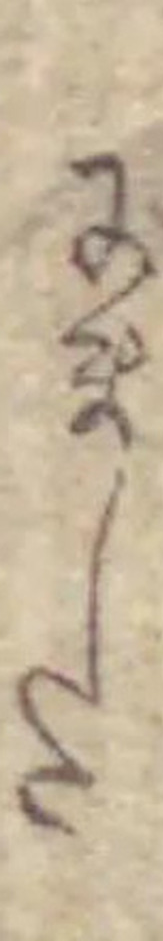にました
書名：珍説女天狗 2巻
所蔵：国立国会図書館 National Diet Library, JAPAN
